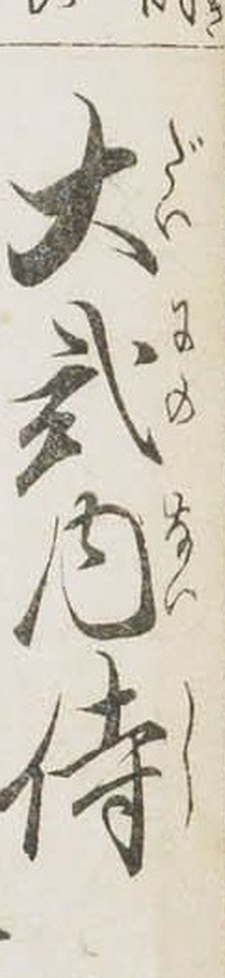大弐内侍
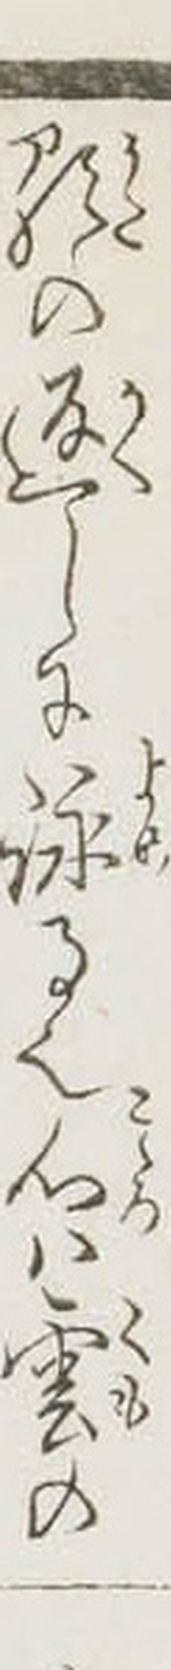歌の返しに詠る也心は雲の
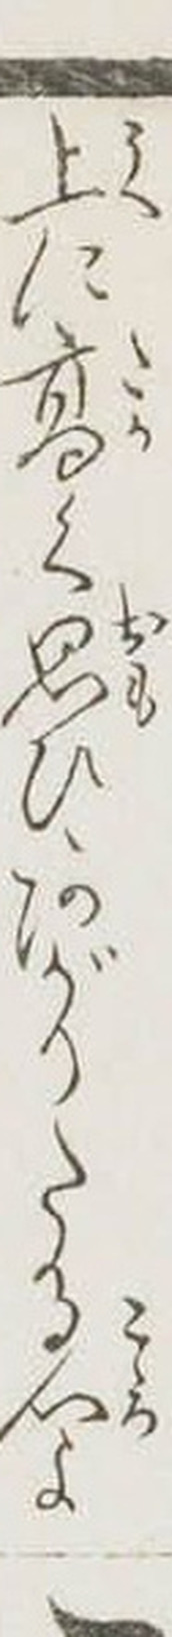上に高く思ひあがりたる心よ
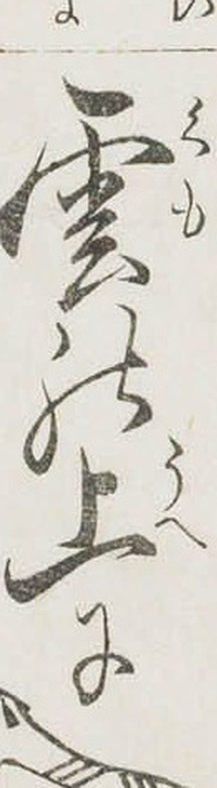雲の上に
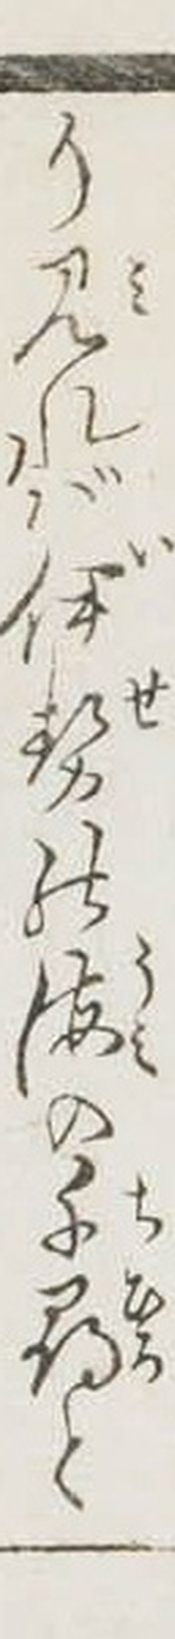り見れべ伊勢の海の千尋と
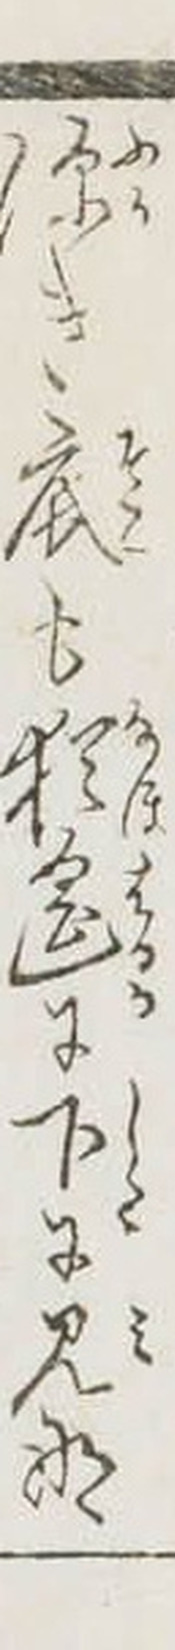深き底も猶遙に下に見な
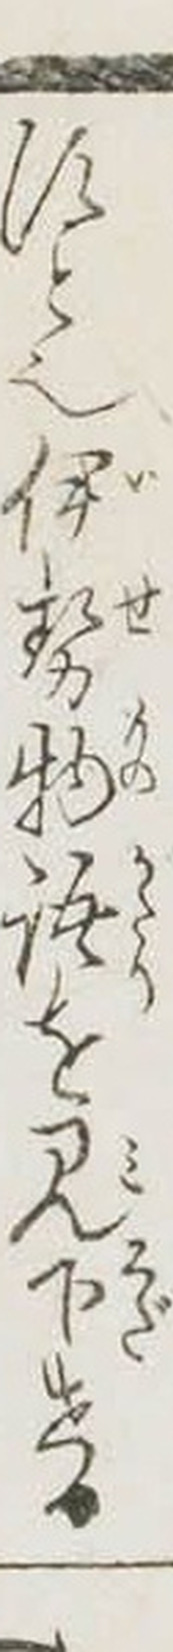すと也伊勢物語を見下せる
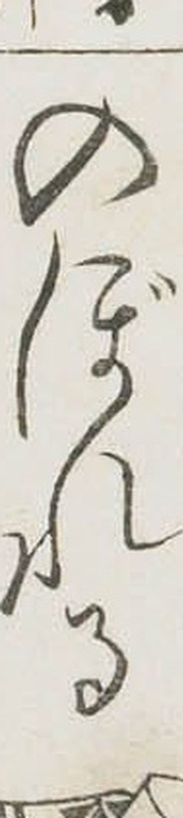のぼれる
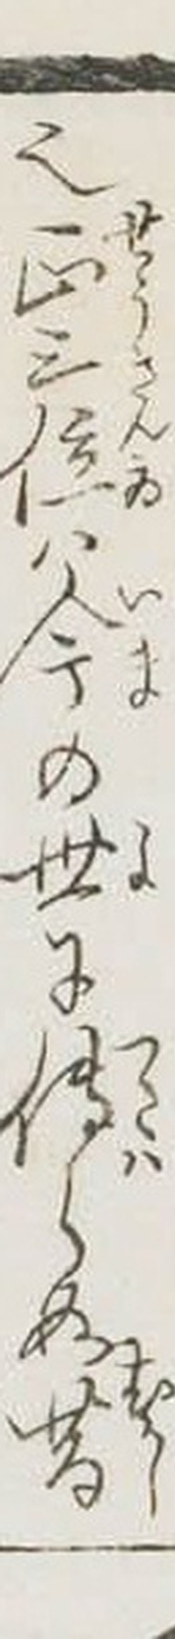也正三位は今の世に伝らぬ昔
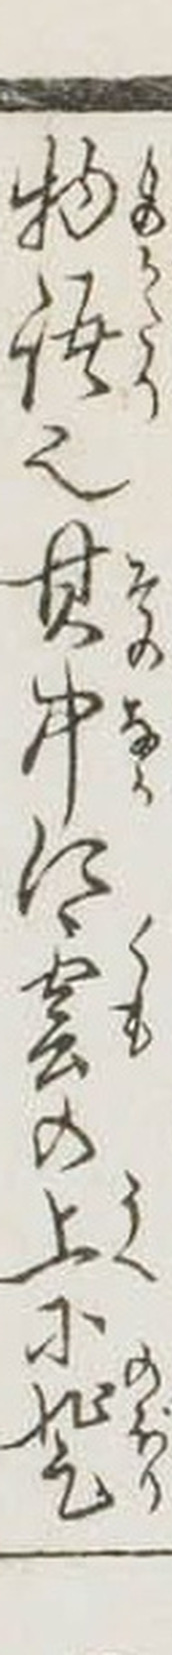物語也其中に雲の上に登
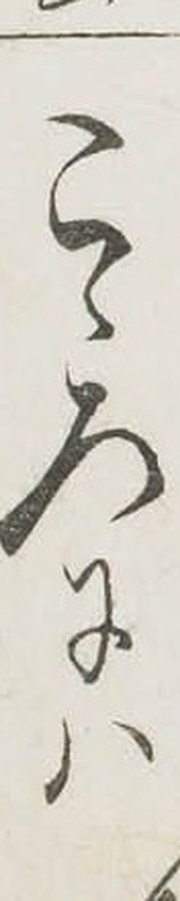こゝろには
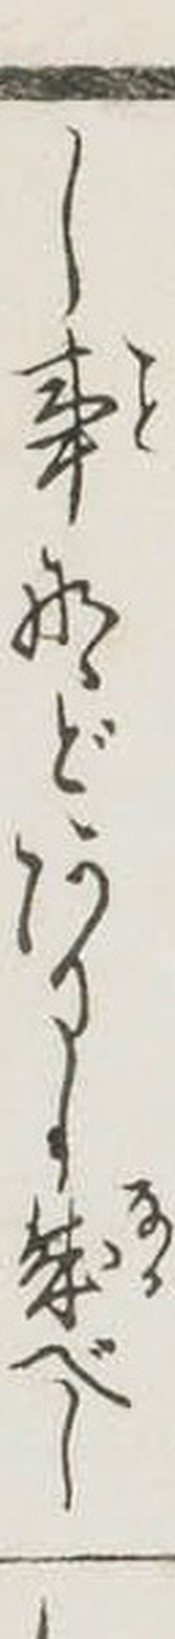し事などありし成べし
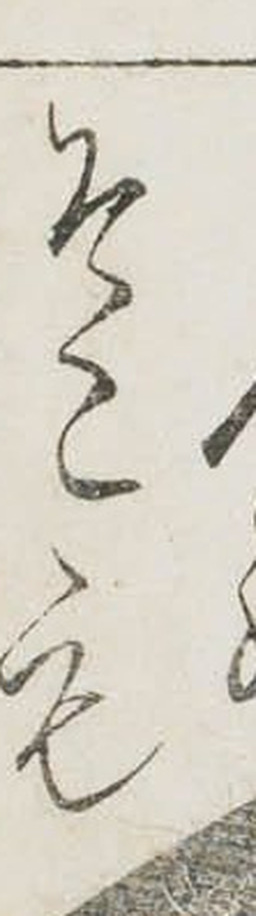そこも
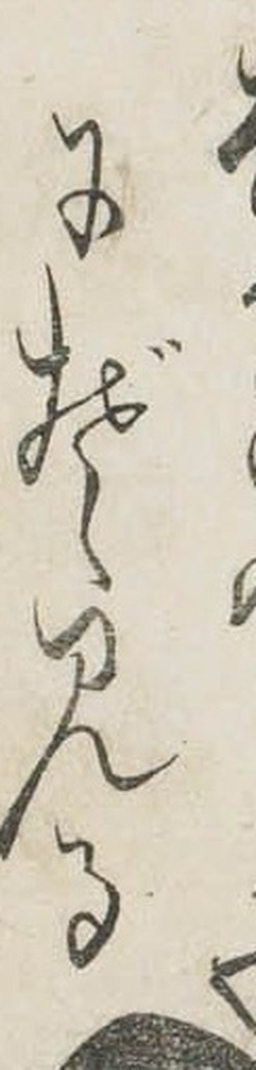にぞ見る

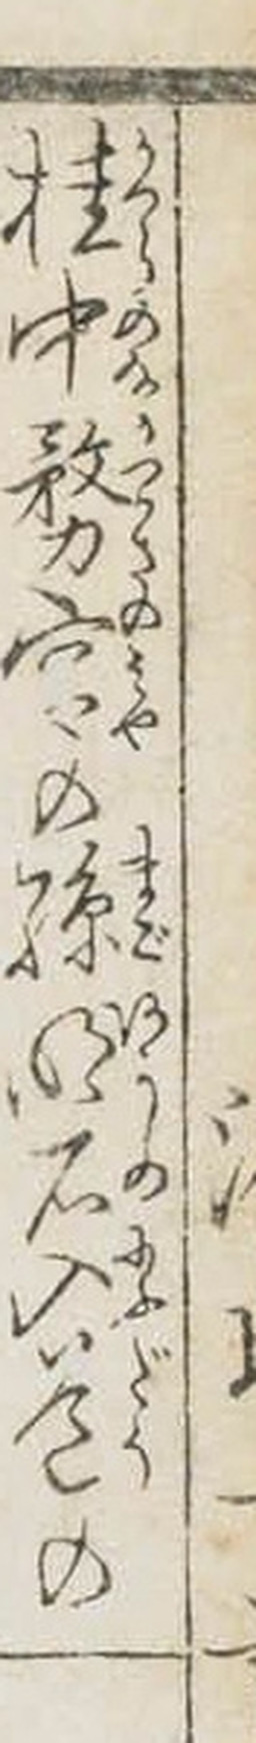桂中務宮の孫明石入道の
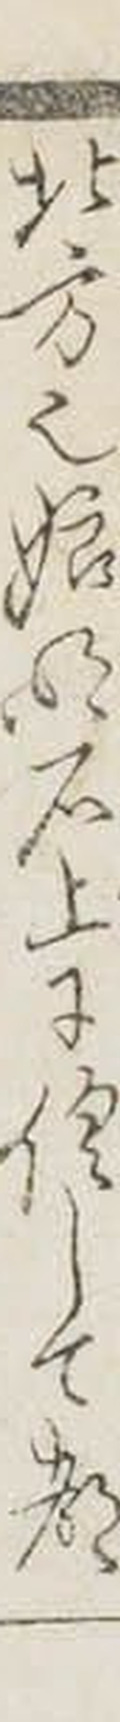北方也娘明石上に倶して都
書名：源氏百人一首
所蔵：東京学芸大学教育コンテンツアーカイブ
